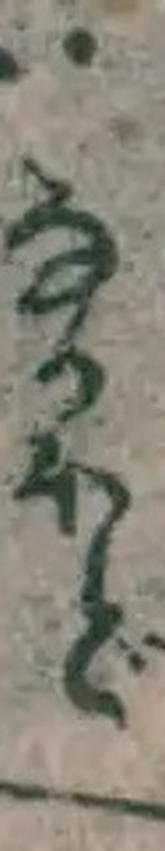なるほど
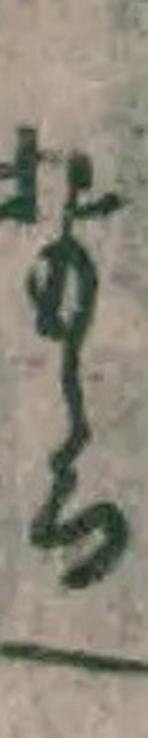おもしろ
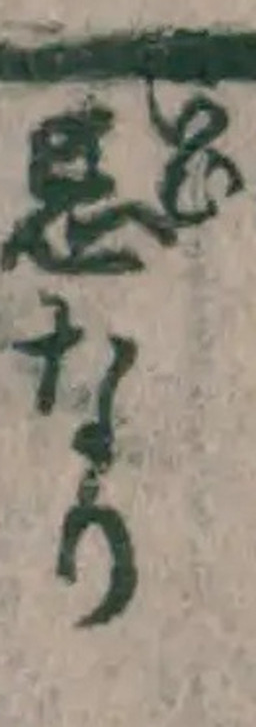忌なり
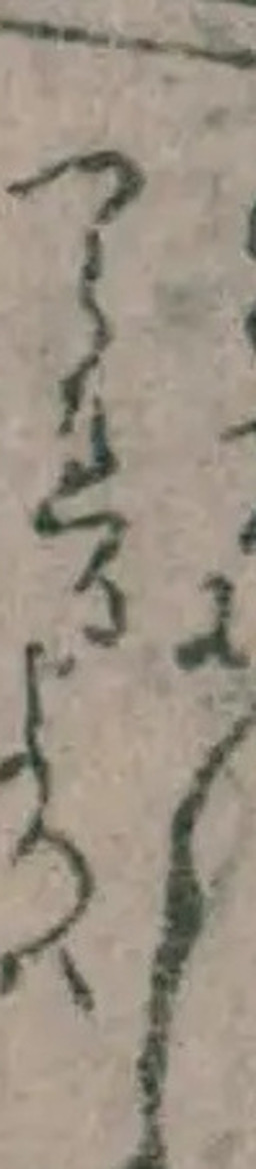つられるよりは
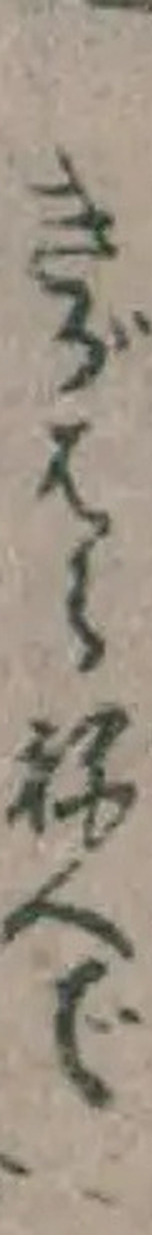きがはらねへで
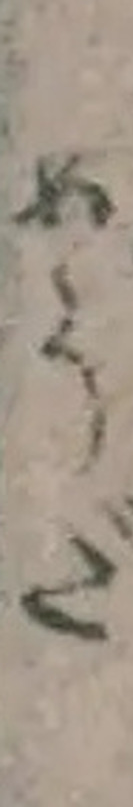めうだ

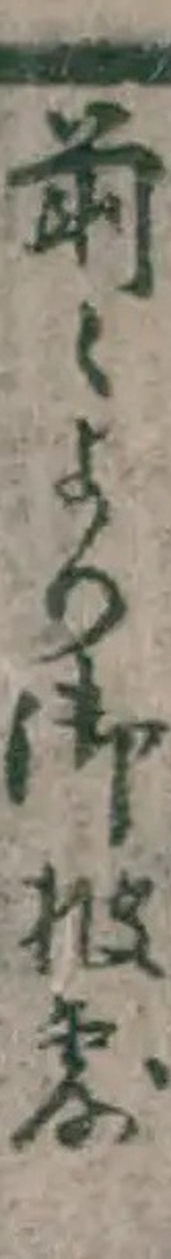前々より御披露
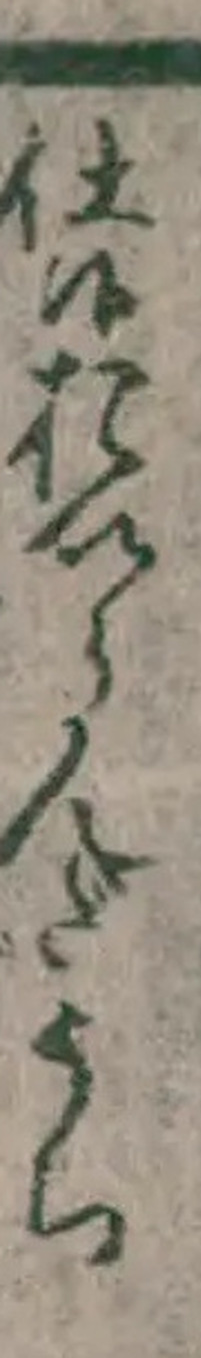仕候おいらんだうち
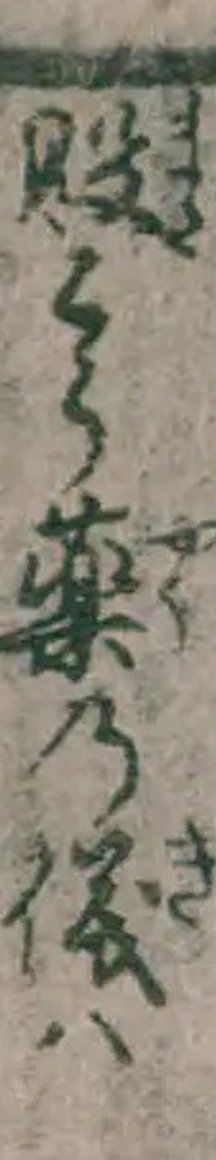股こう薬の儀は
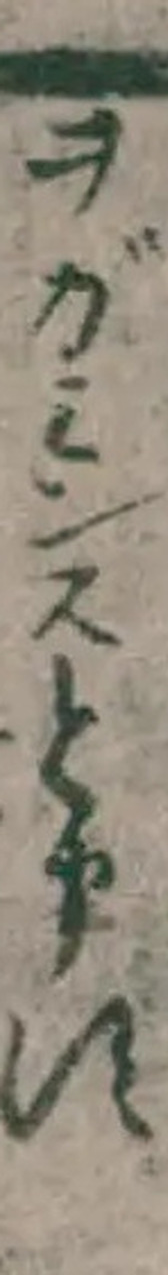ヲガミンスと申す
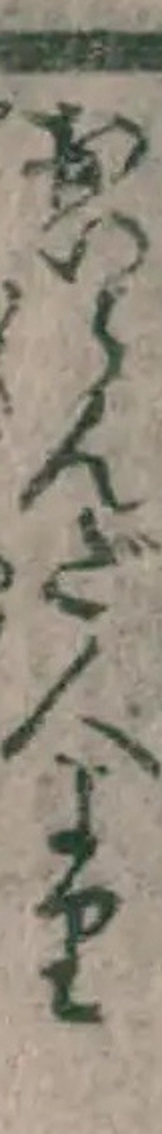おいらんだ人より
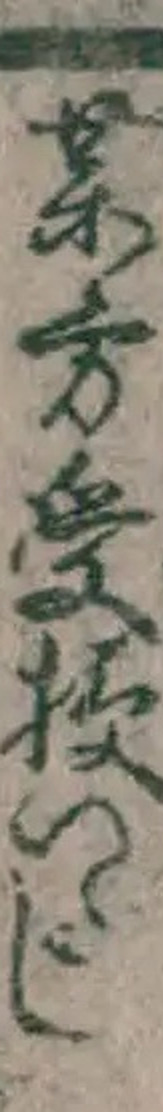薬方授受いたし
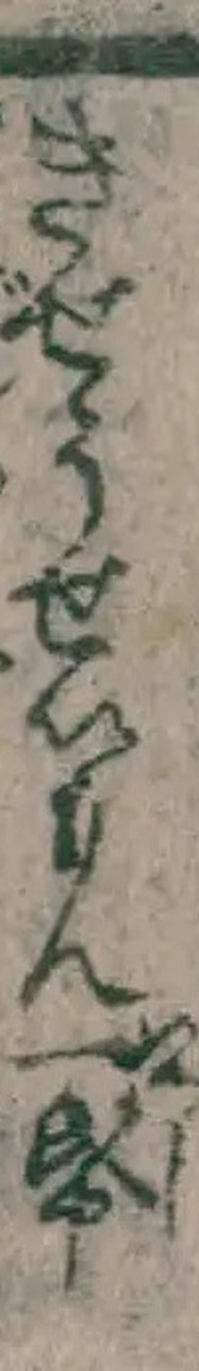きせうせいもん一紙
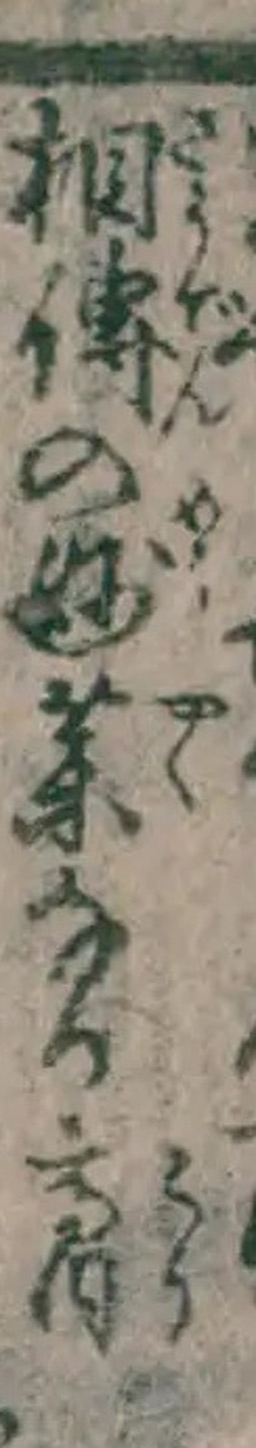相伝の妙薬なり膏
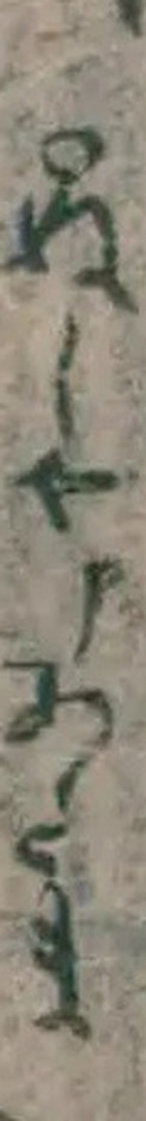○ぬしやアあたま
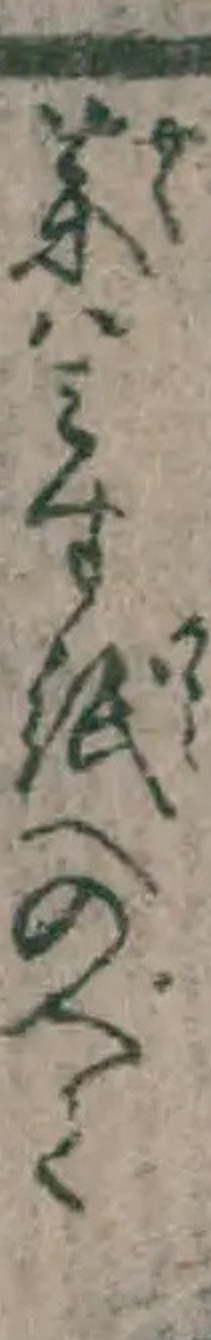薬はみす紙へのへて
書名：視薬霞報条 3巻
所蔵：国立国会図書館 National Diet Library, JAPAN
